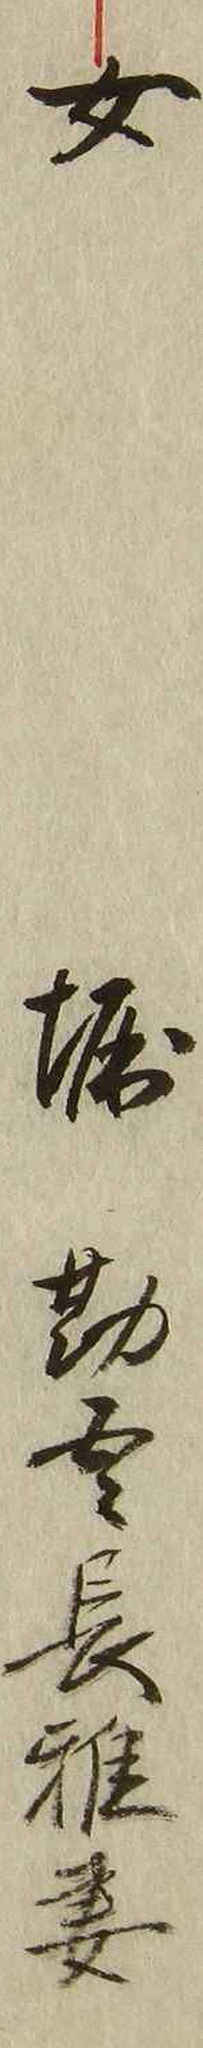女堀勘吾長雅妻
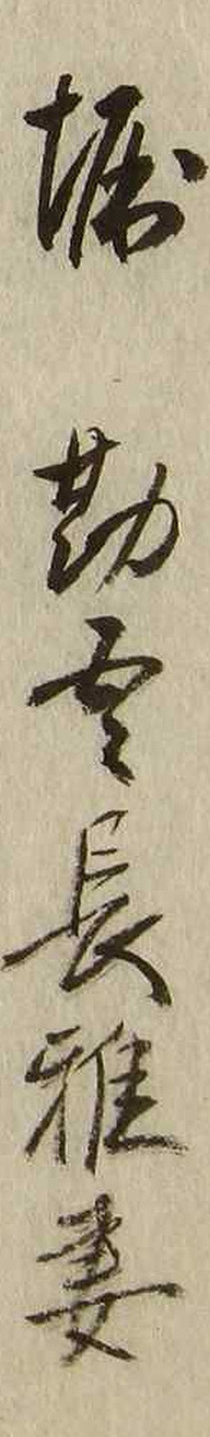女堀勘吾長雅妻
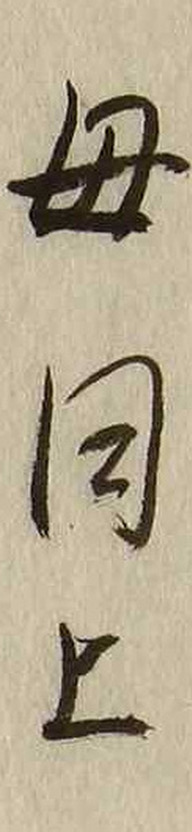母同上
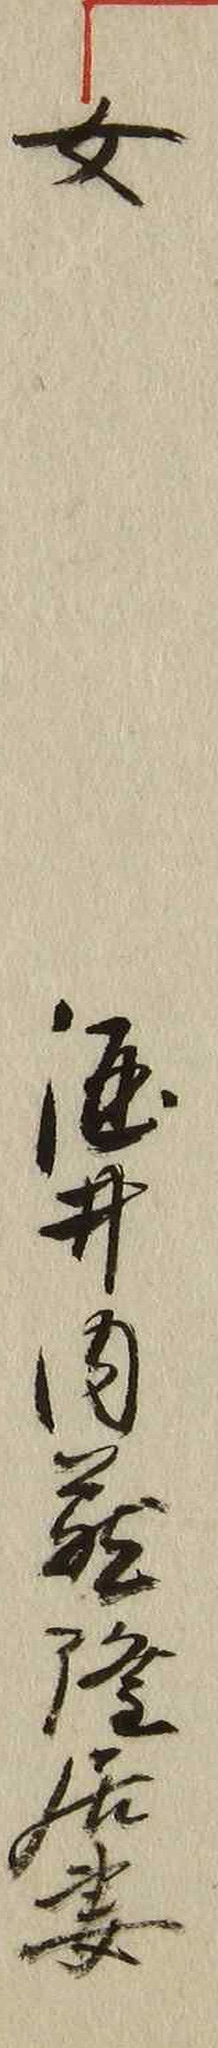女酒井内蔵隆居妻
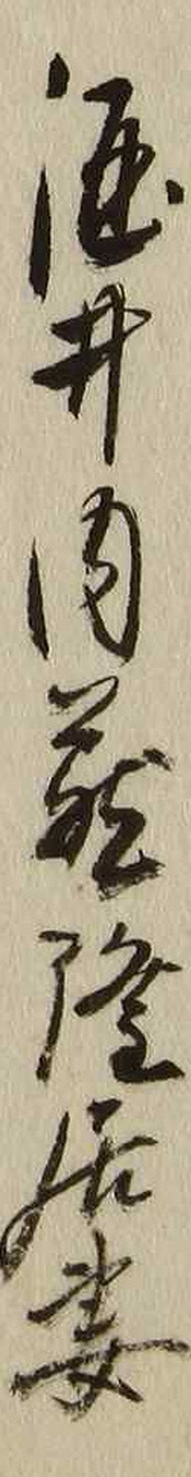女酒井内蔵隆居妻
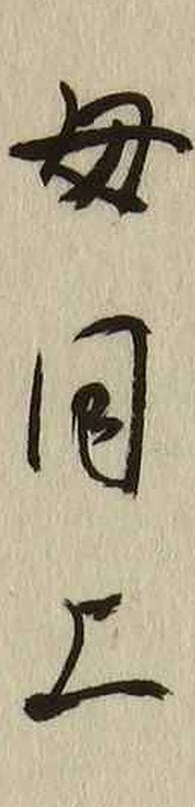母同上
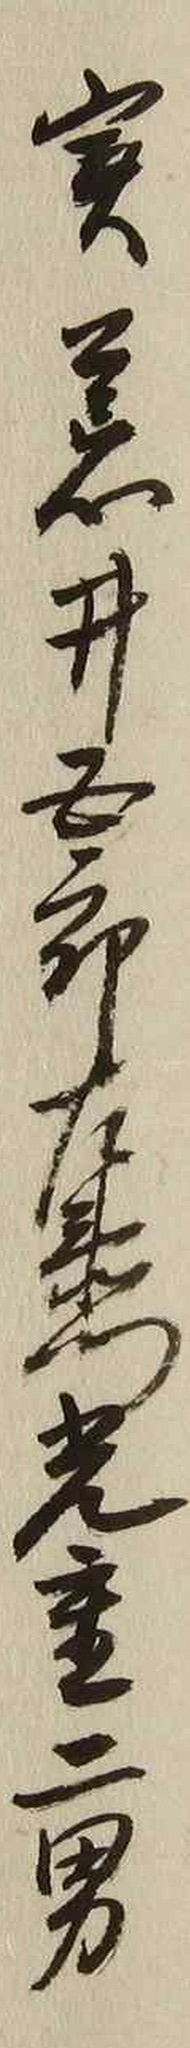実荒井五郎左衛門光重二男
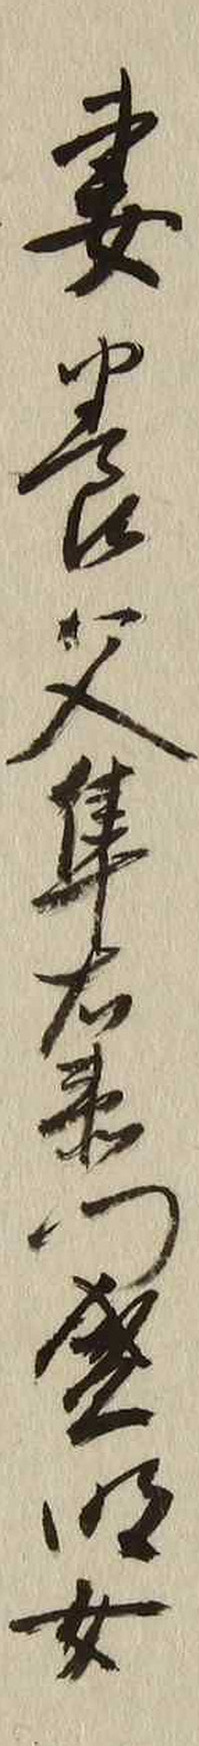妻養父隼右衛門盛明女
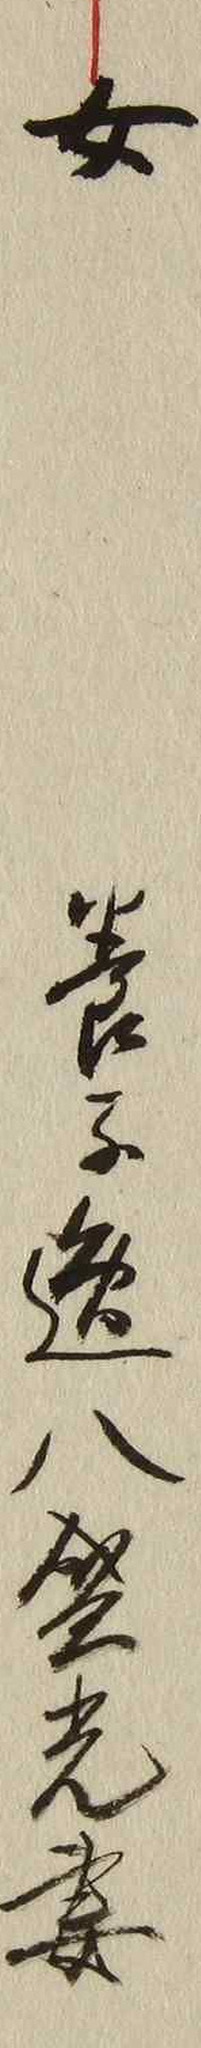女養子逸八盛光妻
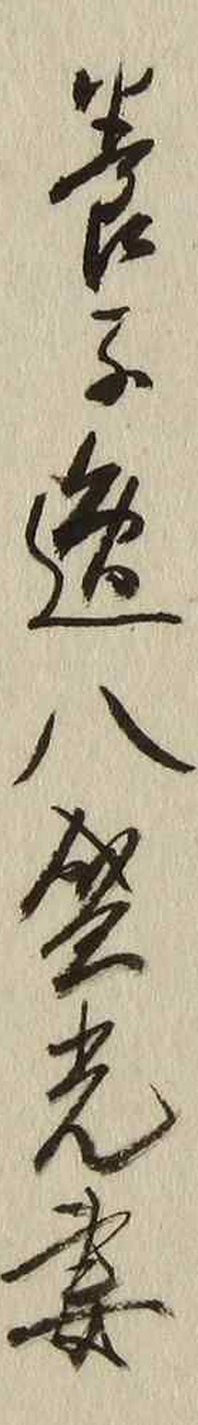女養子逸八盛光妻
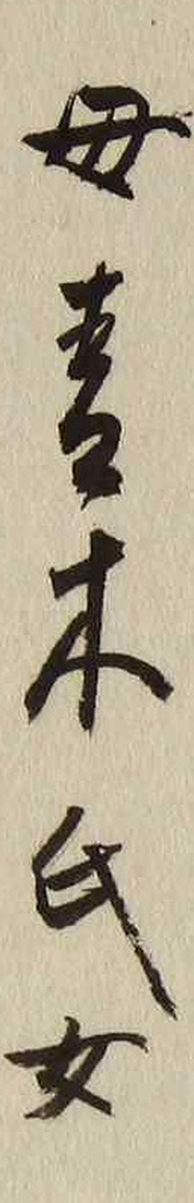母青木氏女
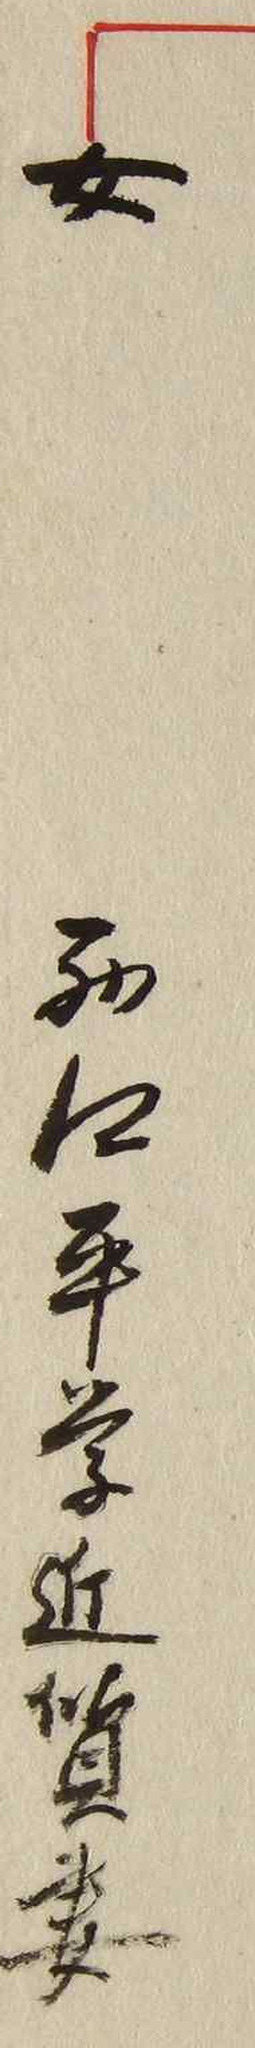女西郷平学近質妻
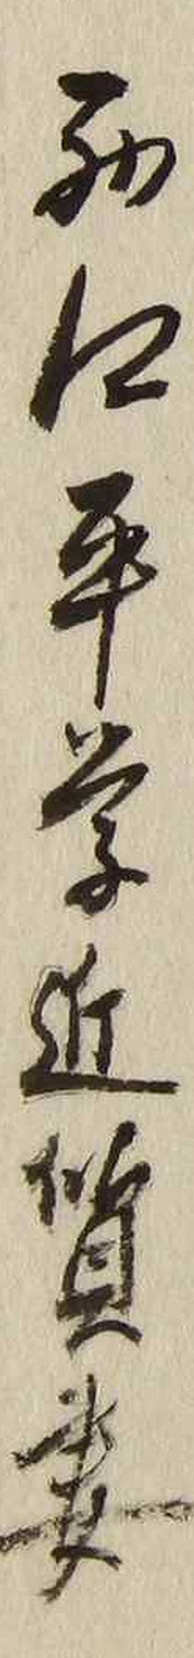女西郷平学近質妻

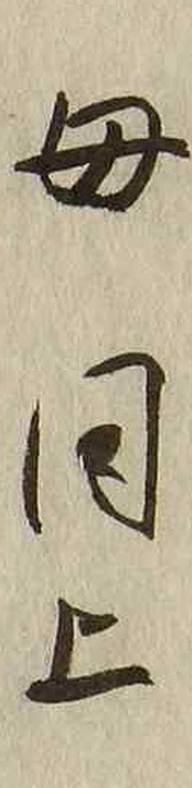母同上
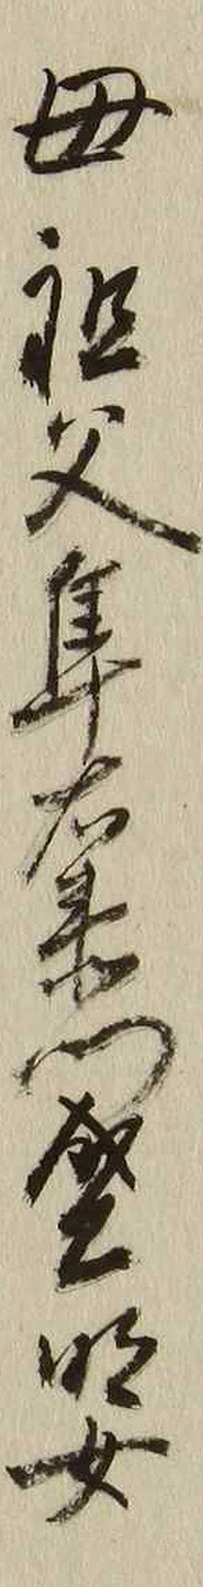母祖父隼右衛門盛明女
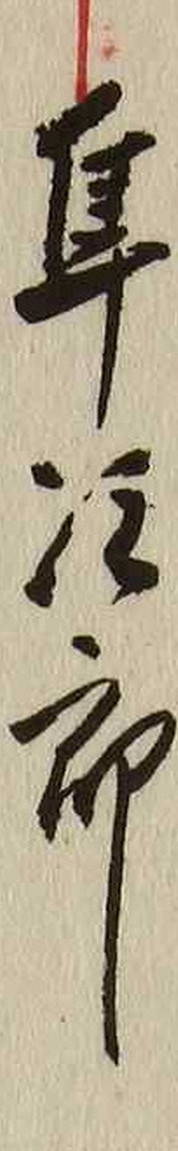隼次郎
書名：諸士系譜　巻之346　も之部2
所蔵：会津若松市立会津図書館
